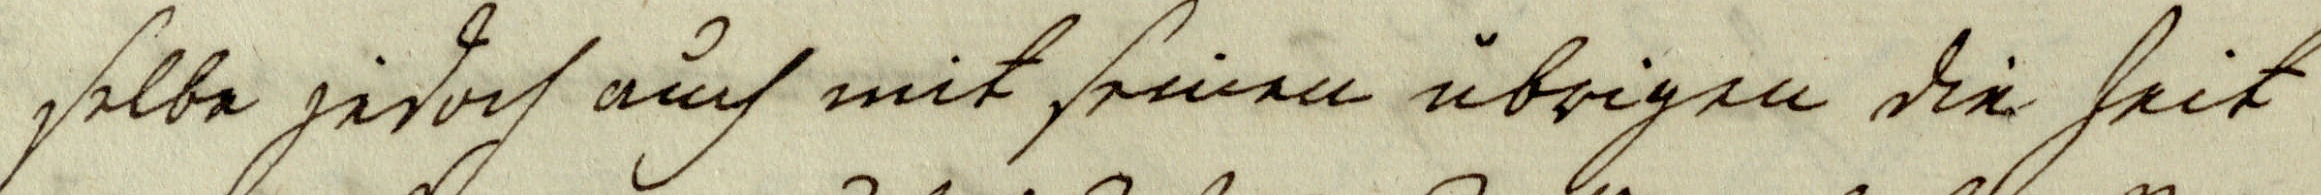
selbe jedoch auch mit seinen übrigen die Zeit
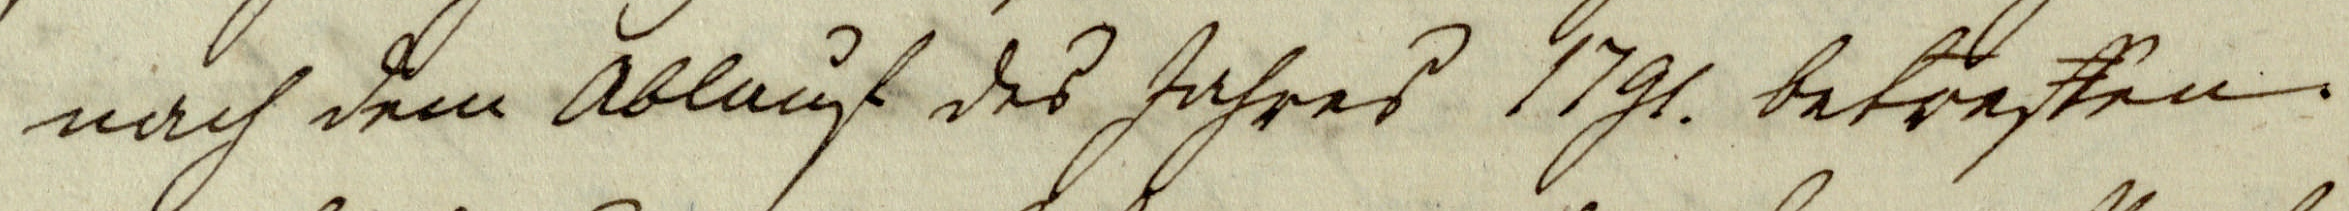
nach dem Ablauf des Jahres 1791. betreffen¬
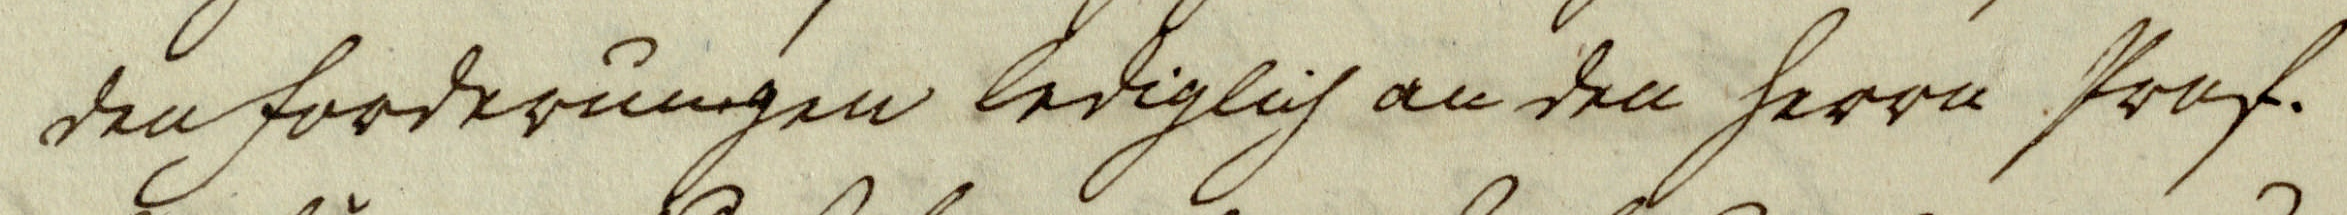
den Forderungen lediglich an den Herrn Prof.
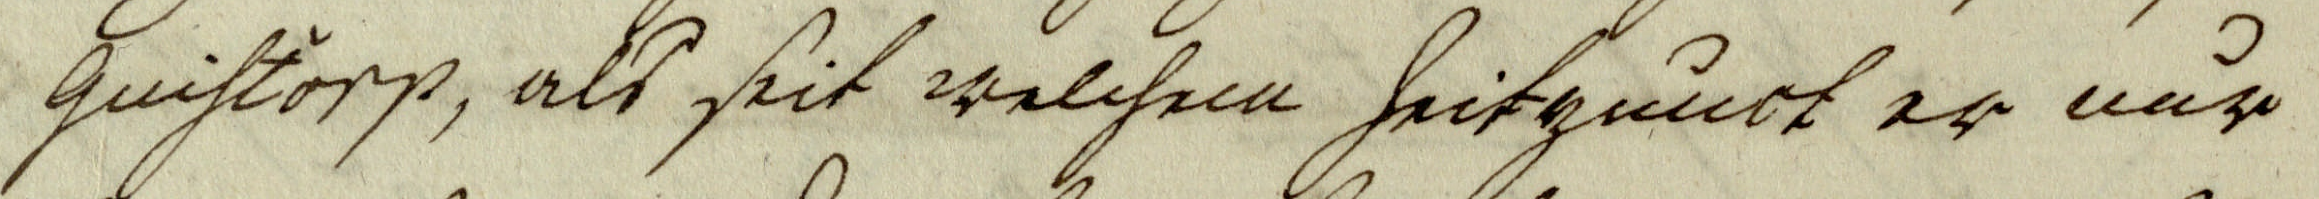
Quistorp, als seit welchem Zeitpunct er nur
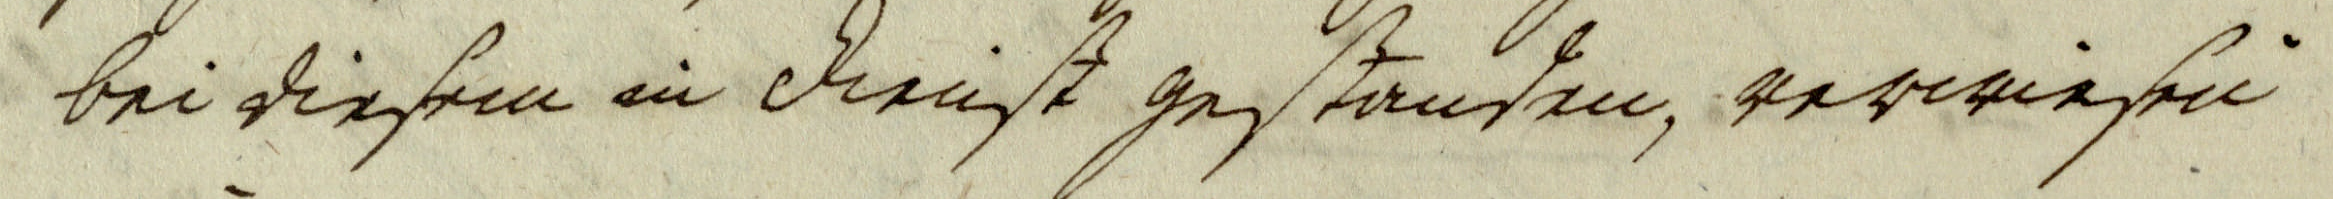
bei diesem in Dienst gestanden, verwiesen
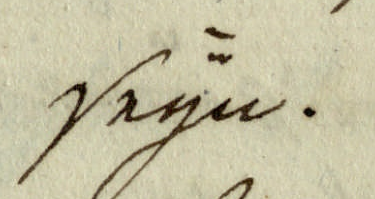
seÿn.
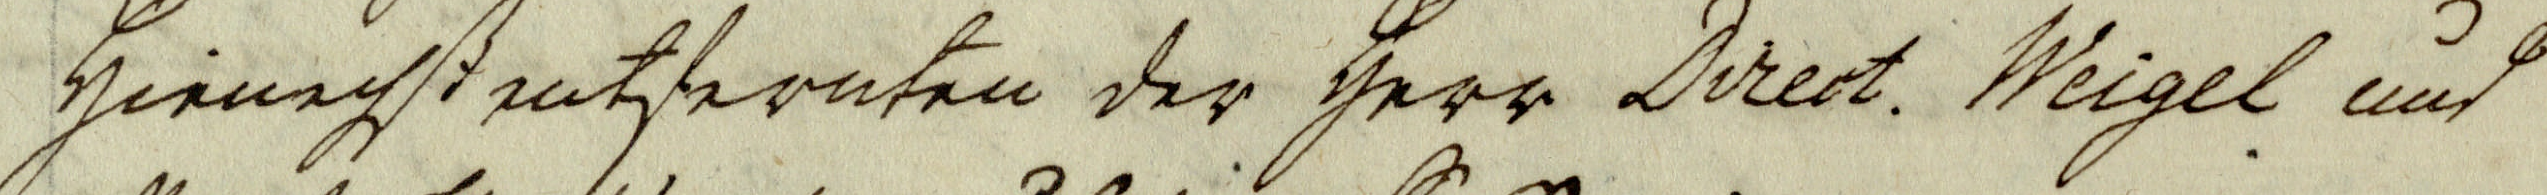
Hienechst entfernten der Herr Direct. Weigel und
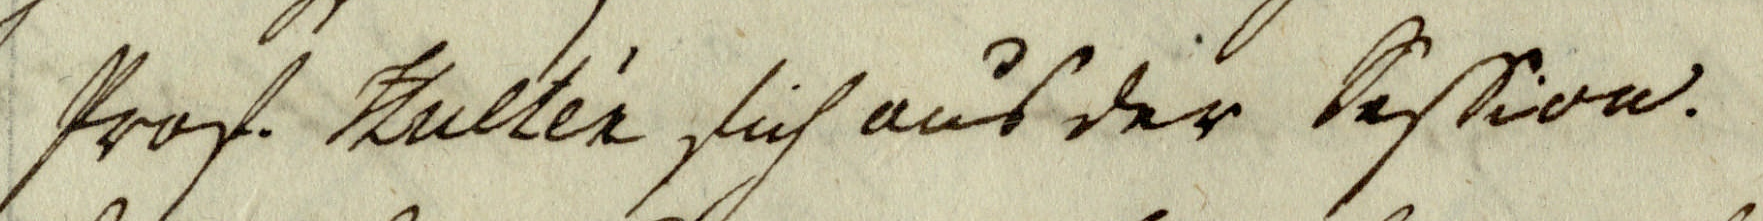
Prof. Hultén sich aus der Session.
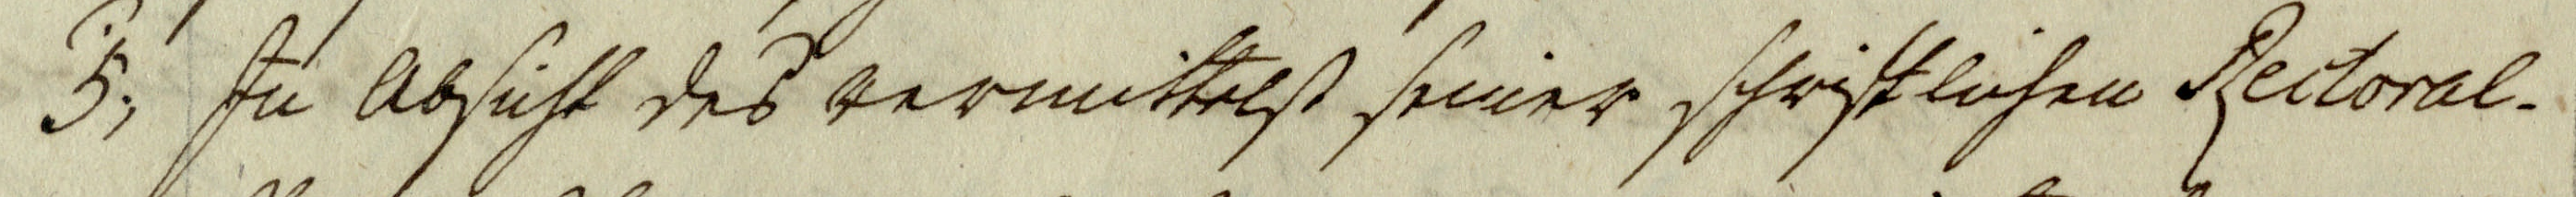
5., In Absicht des vermittelß seiner schriftlichen Rectoral¬
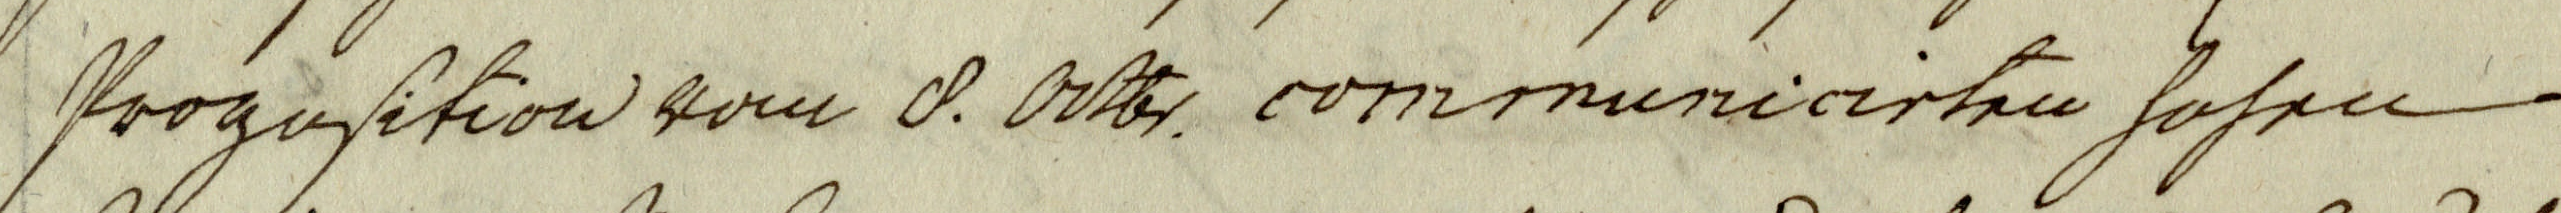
Proposition vom 8. Octbr. communicirten hohen
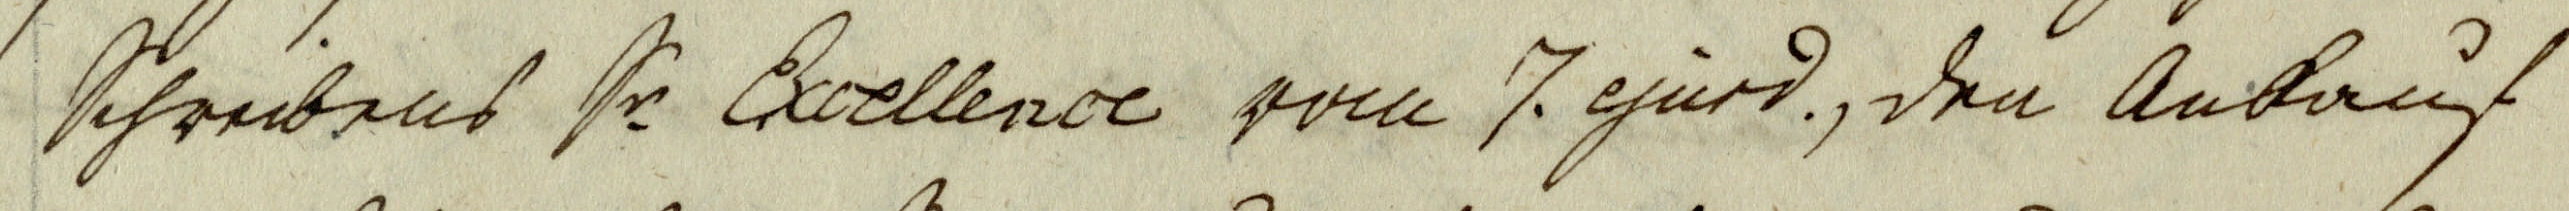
Schreibens Sr. Excellence vom 7. ejusd., den Ankauf
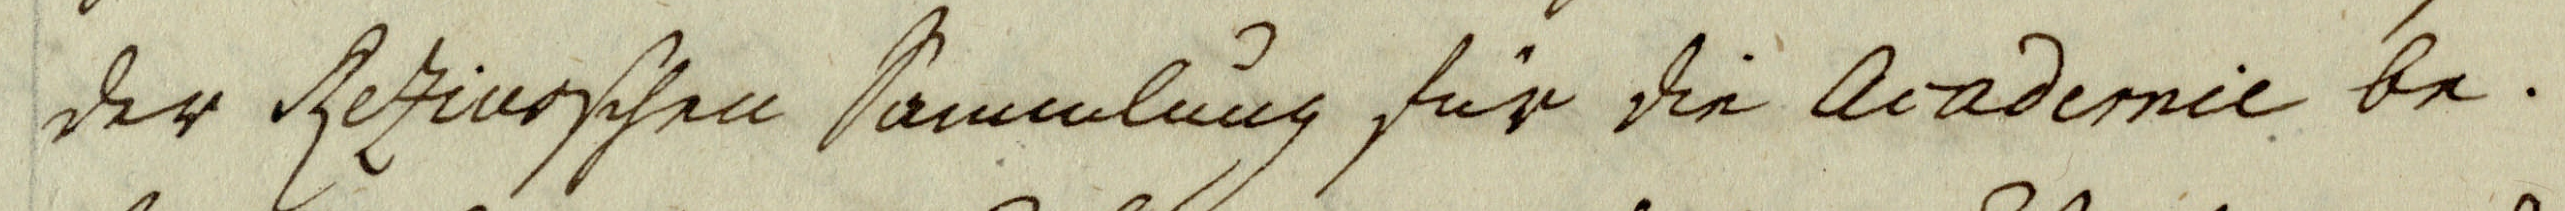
der Reziusschen Sammlung für die Academie be¬
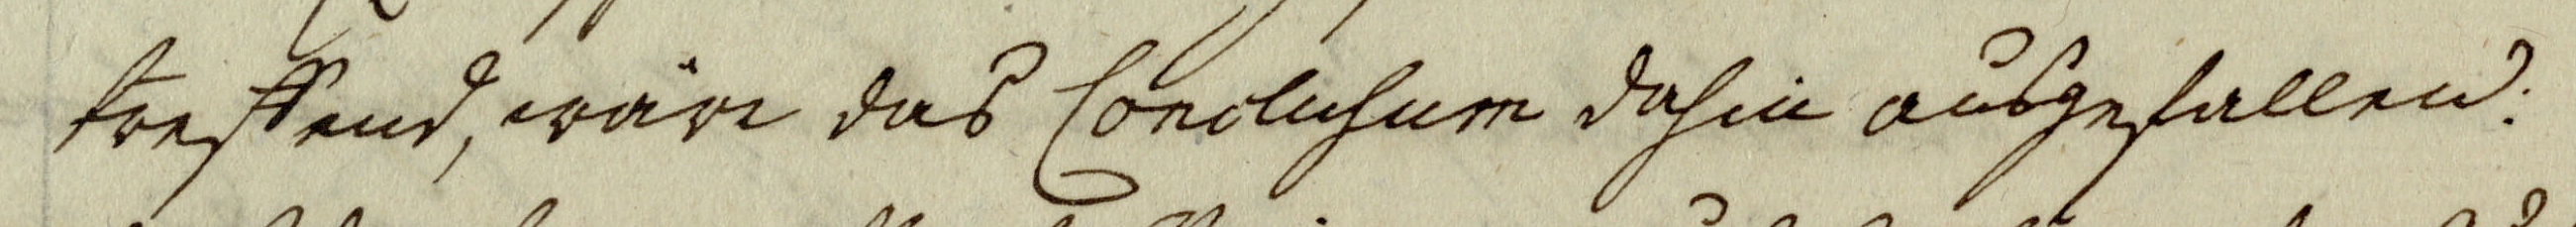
treffend, wäre das Conclusum dahin ausgefallen:
